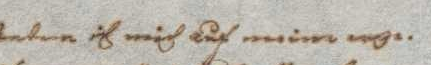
Indem ich mich auf meine erge-
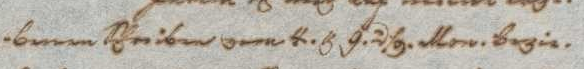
benen Schreiben vom 4. & 9. dss. Mon. bezie-
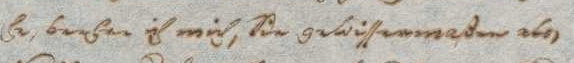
he, beehre ich mich, Sie gewissermaßen als
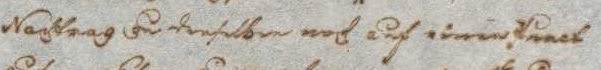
Nachtrag zu denselben noch auf einen Punct
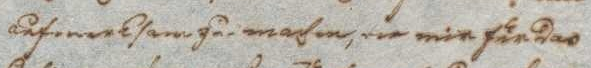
aufmerksam zu machen, der mir für das
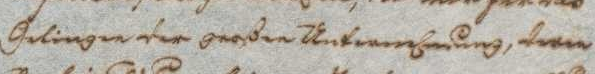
Gelingen der großen Unternehmung, deren
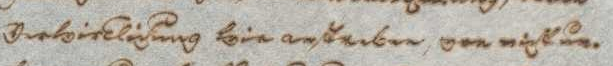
Verwirklichung wir anstreben, von nicht un-
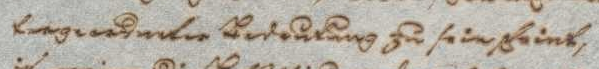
tergeordneter Bedeutung zu sein scheint,
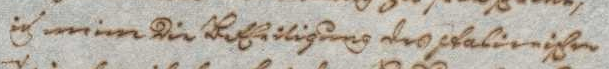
ich meine die Betheiligung des Italienischen
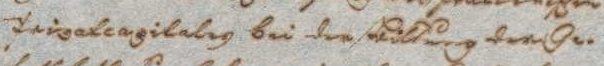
Privatcapitales bei der Bildung der Ge-
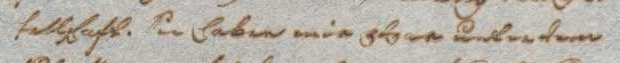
sellschaft. Sie haben mir zwar unter dem
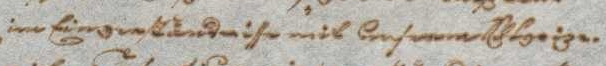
im Einverständnisse mit unserem Schweize-
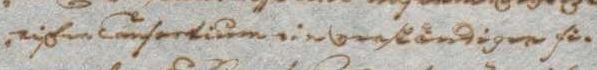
rischen Consortium ein verständiger Fi-
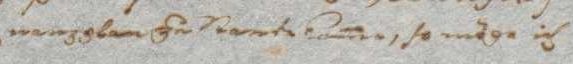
nanzplan zu Stande komme, so möge ich
